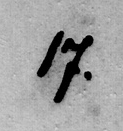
9.
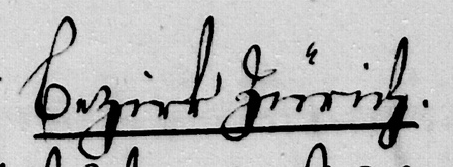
Bezirk Zürich.
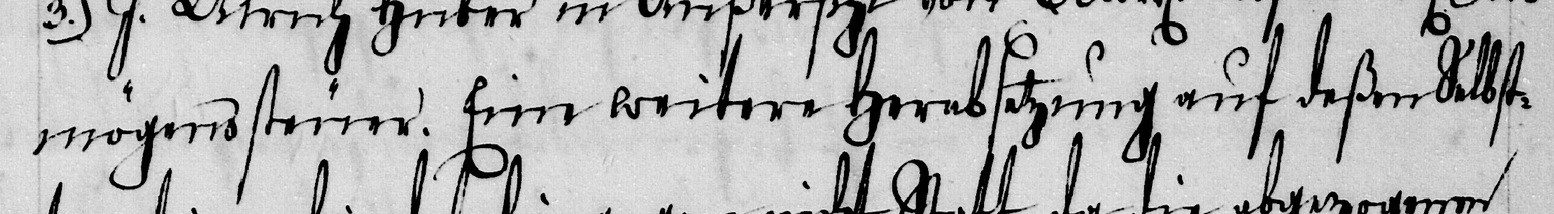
mögenssteuer. Eine weitere Herabsetzung auf deßen Selbst¬
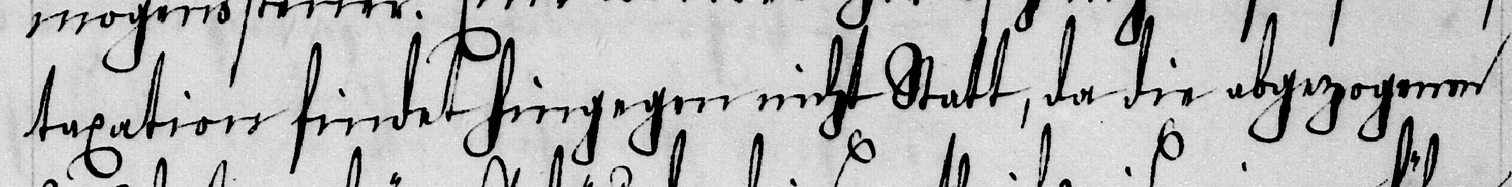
taxation findet hingegen nicht Statt, da die abgezogenen
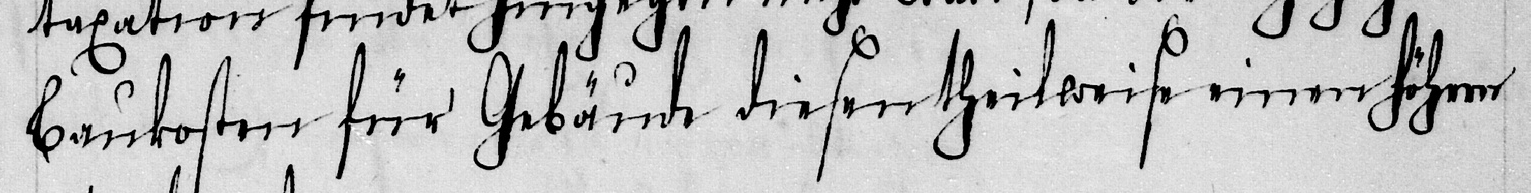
Baukosten für Gebäude diesen theilweise einen höhern
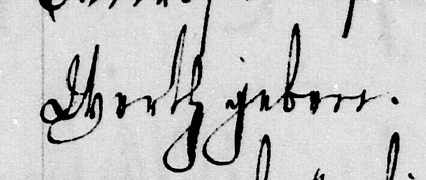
Werth geben.
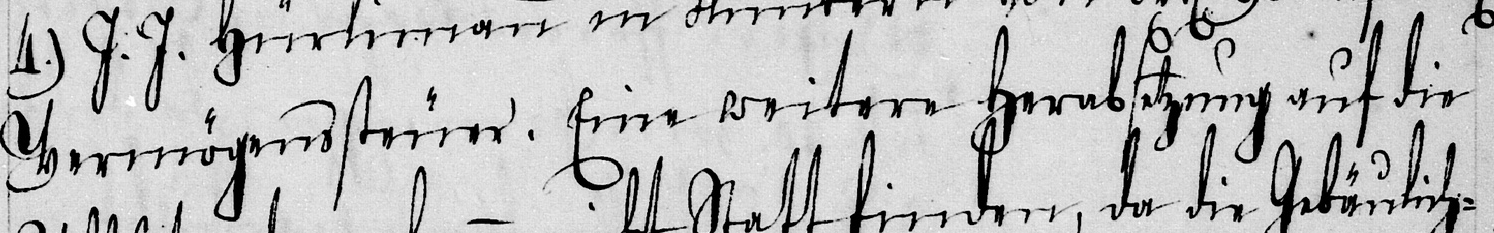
Vermögenssteuer. Eine weitere Herabsetzung auf die
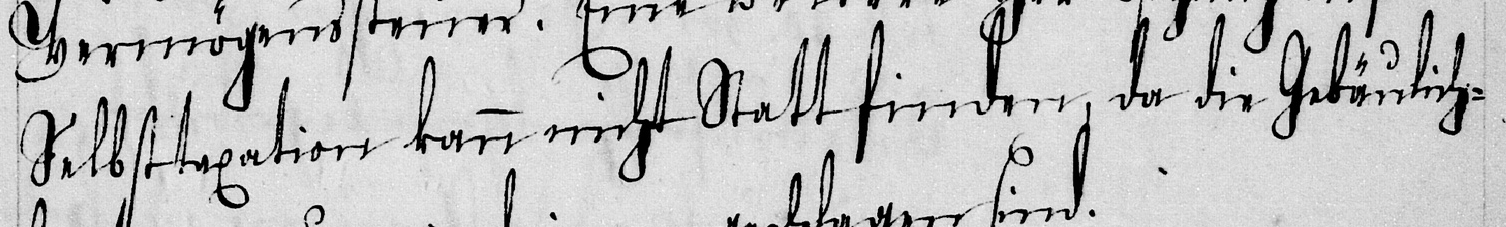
Selbsttaxation kann nicht Statt finden, da die Gebäulic¬
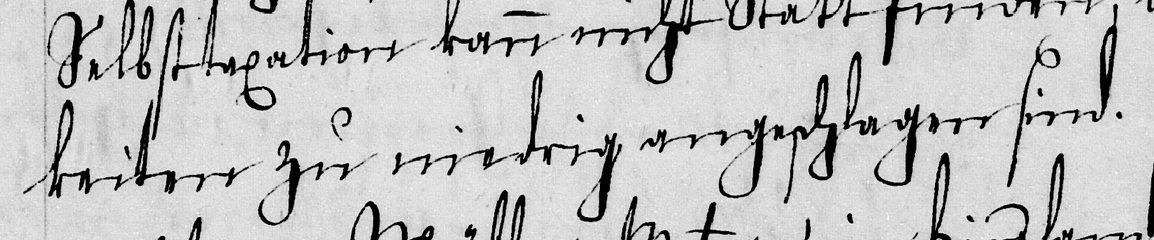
hkeiten zu niedrig angeschlagen sind.
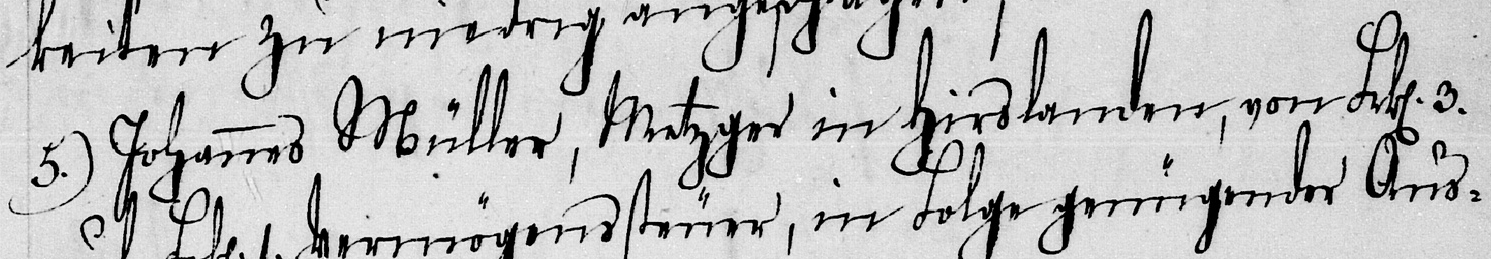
5.) Johannes Müller, Metzger in Hirslanden, von Frk[en].
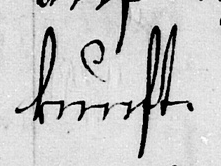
kunft.
